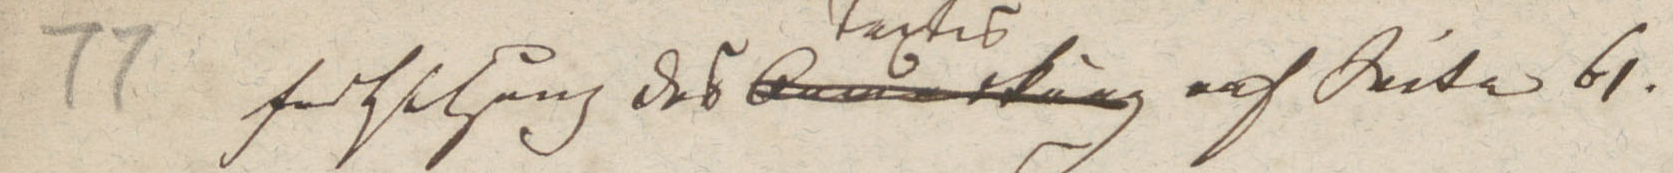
Fortsetzung ders Anmerkung Textes auf Seite 61.
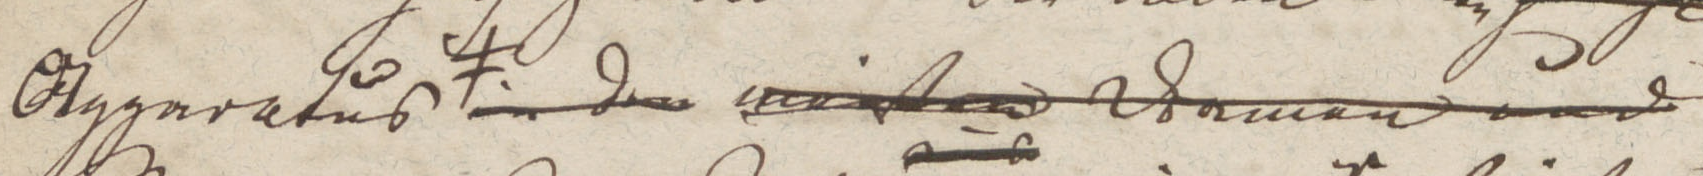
Apparatus in den meisten Dramen und %
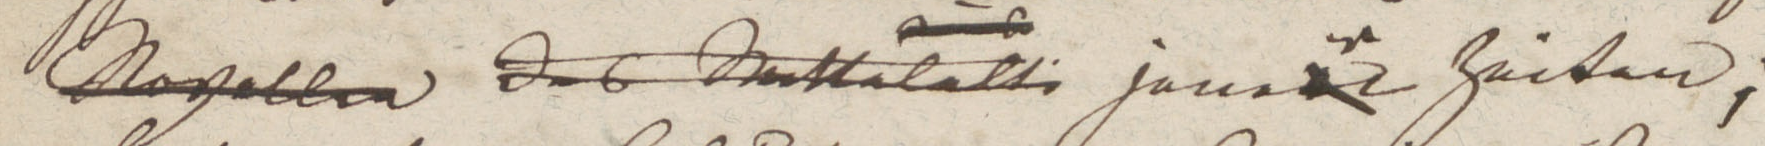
Novellen Das aus jenernr Zeiten;
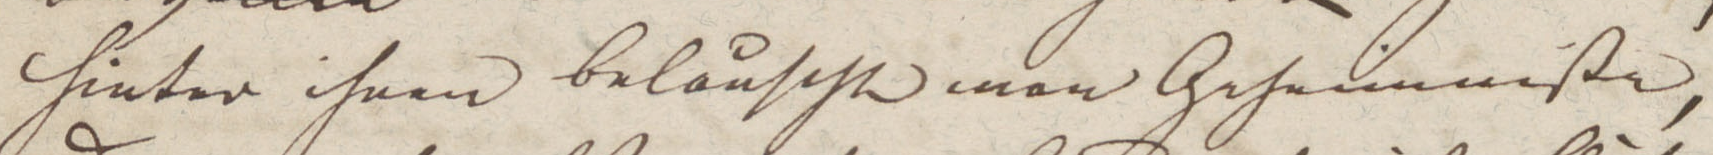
Hinter ihnen belauscht man Geheimnisse,
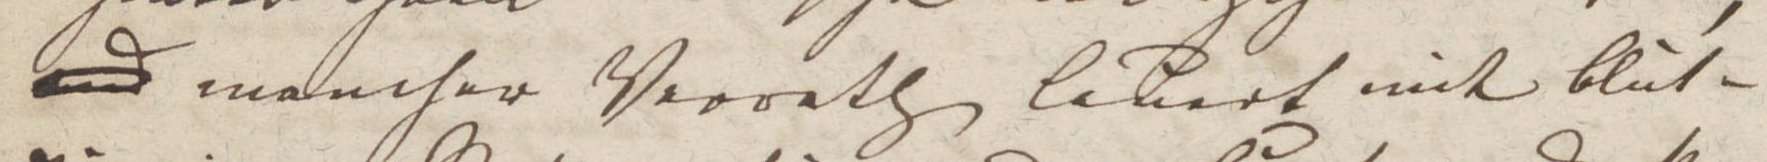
und mancher Verrath lauert mit blut-
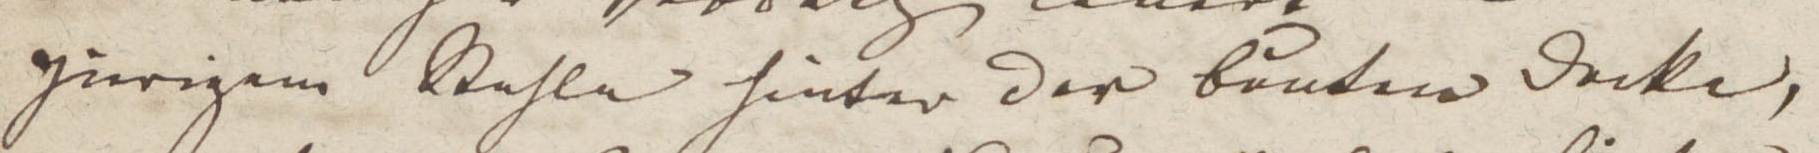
gierigem Stahle hinter der bunten Decke,
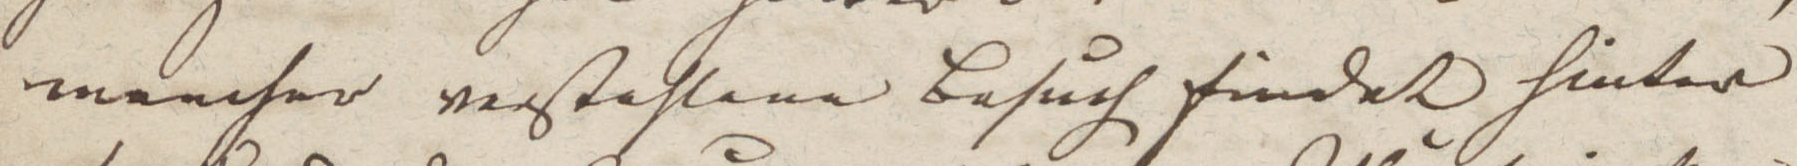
mancher verstohlene Besuch findet hinter
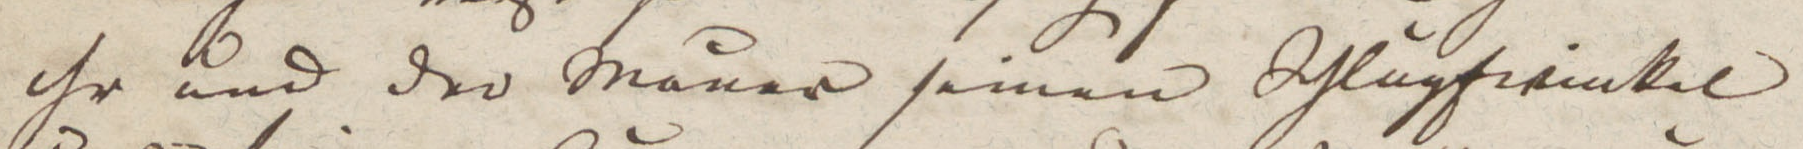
ihr und der Mauer seinen Schlupfwinkel
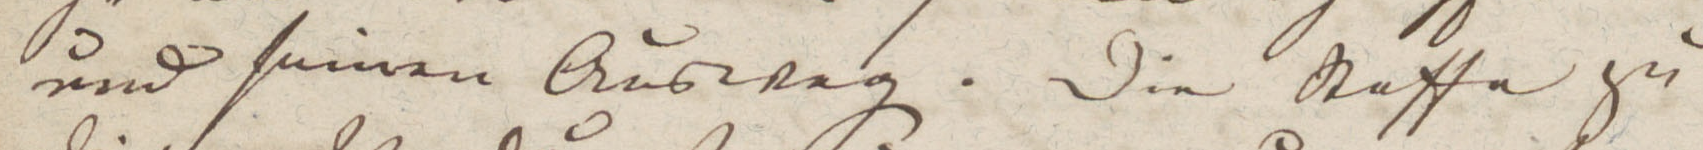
und seinen Ausweg. Die Stoffe zu
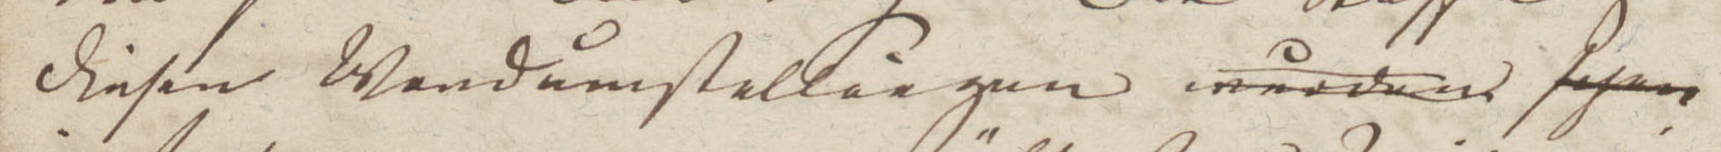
diesen Wandumstellungen wurden schon
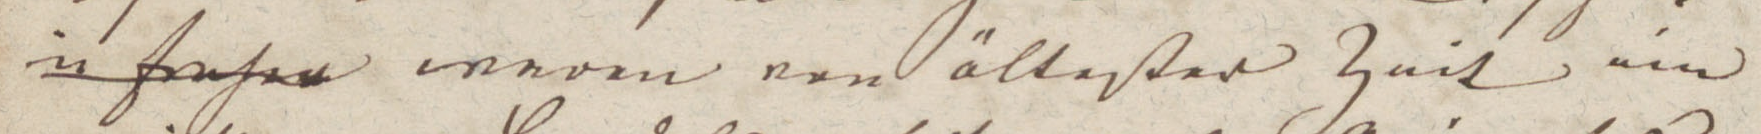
in fruher waren von ältester Zeit ein
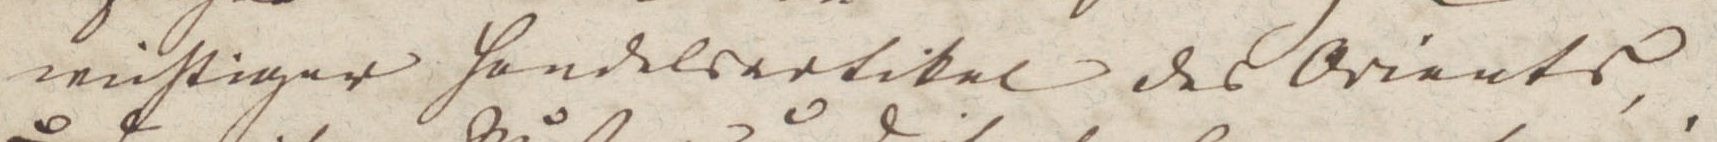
wichtiger Handelsartikel des Orients,
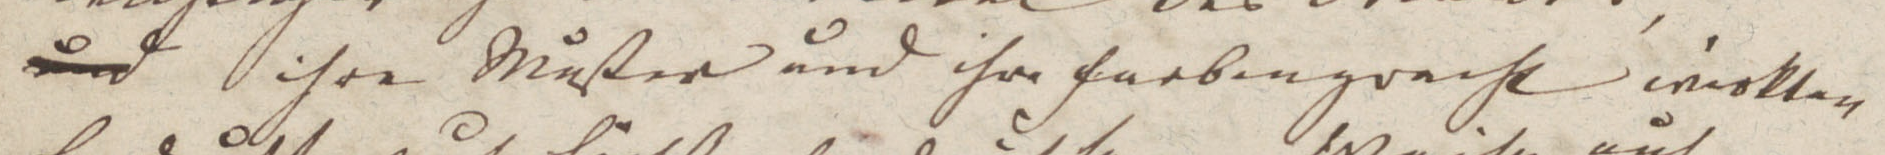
und ihre Muster und ihre Farbenpracht wirkten
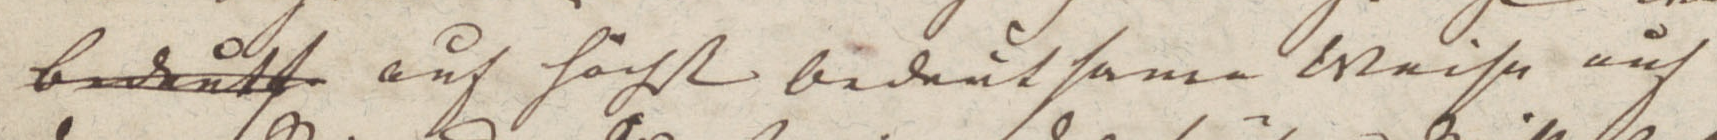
bedeuts auf höchst bedeutsame Weise auf
